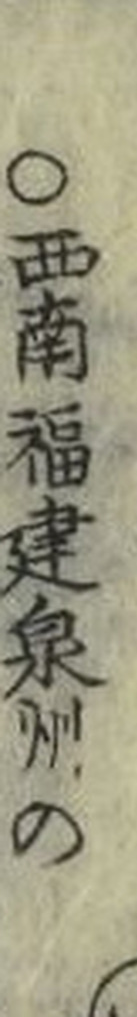○西南福建泉州の
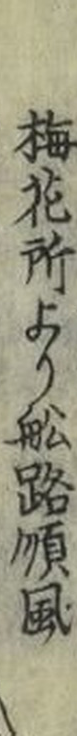梅花所より船路順風
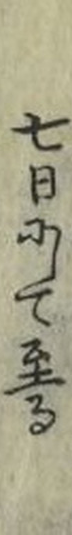七日にして至る
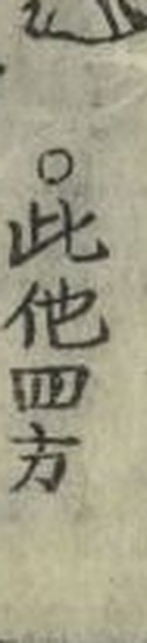○此他四方
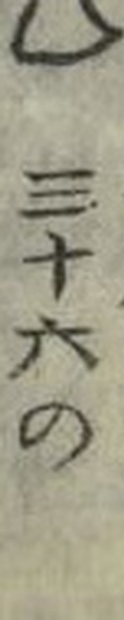三十六の
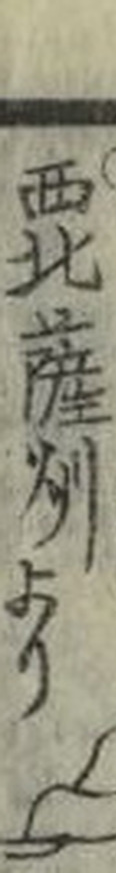○西北薩州より
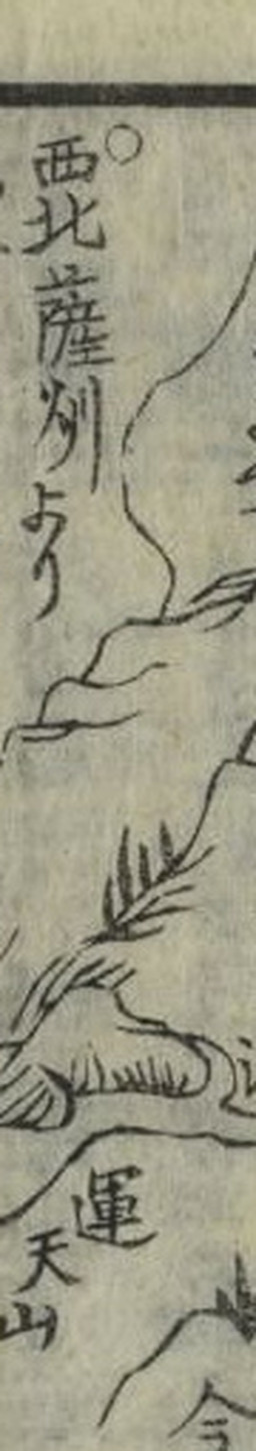○西北薩州より
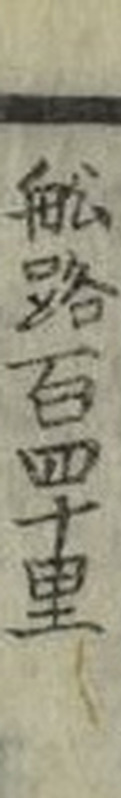船路百四十里
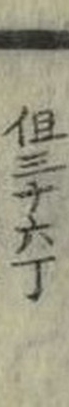但三十六丁
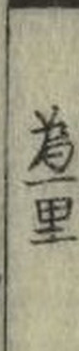為一里

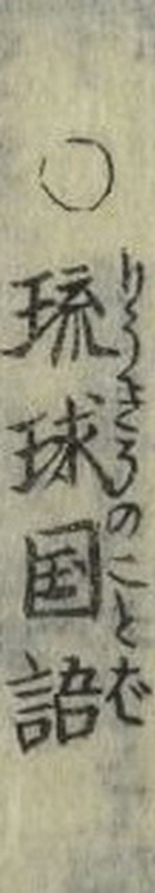○琉球国語
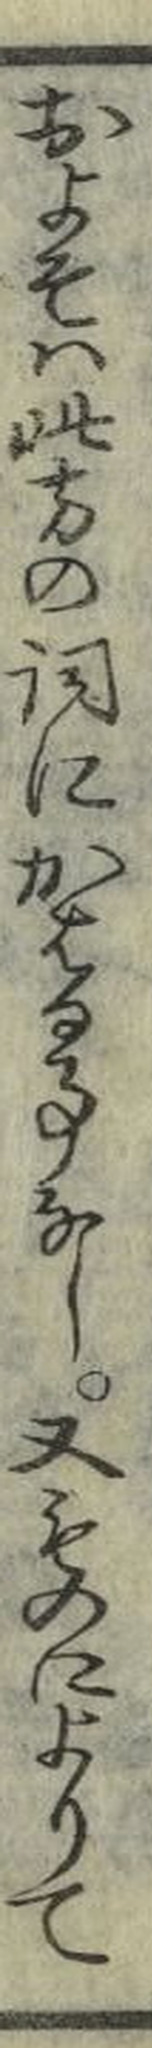およそは此方の詞にかはる事なし。又ものによりて
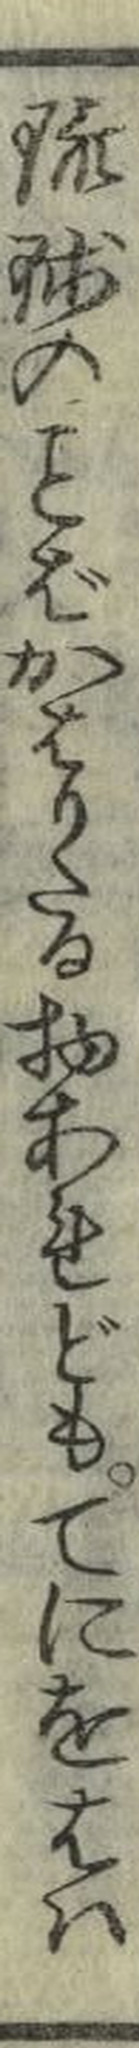琉球のことばかはりたる物あれども。てにをはは
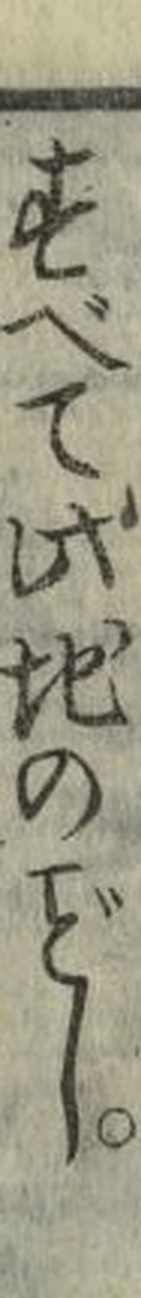すべて此地のごとし。
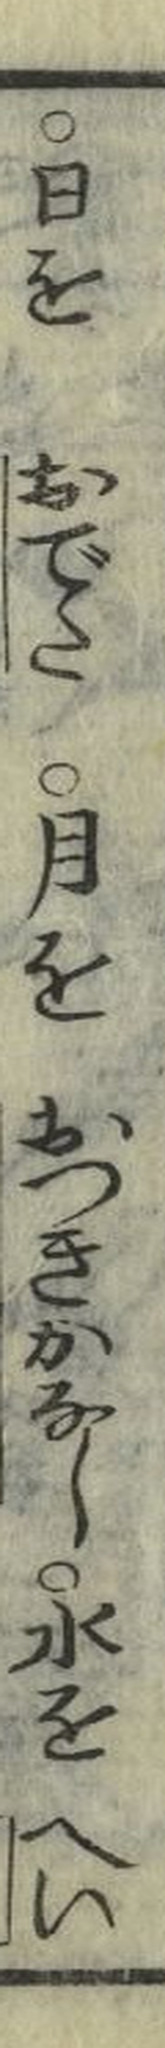○日をおでた○月をおつきかなし○水をへい
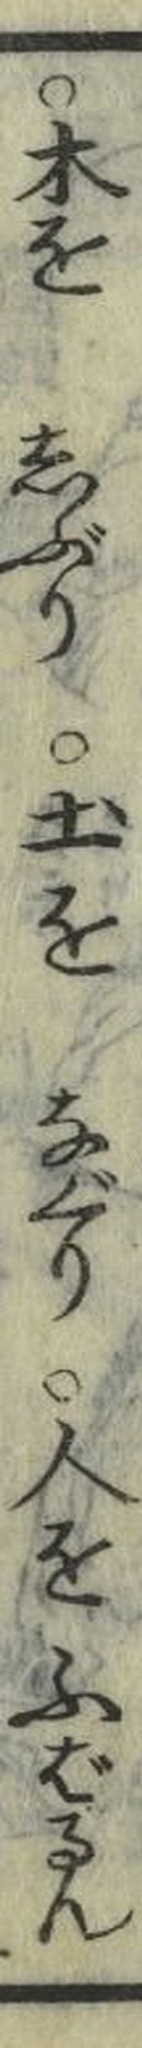○木をしぶり○土をなぐり○人をふばるん
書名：琉球奇譚
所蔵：University of the Ryukyus Library
